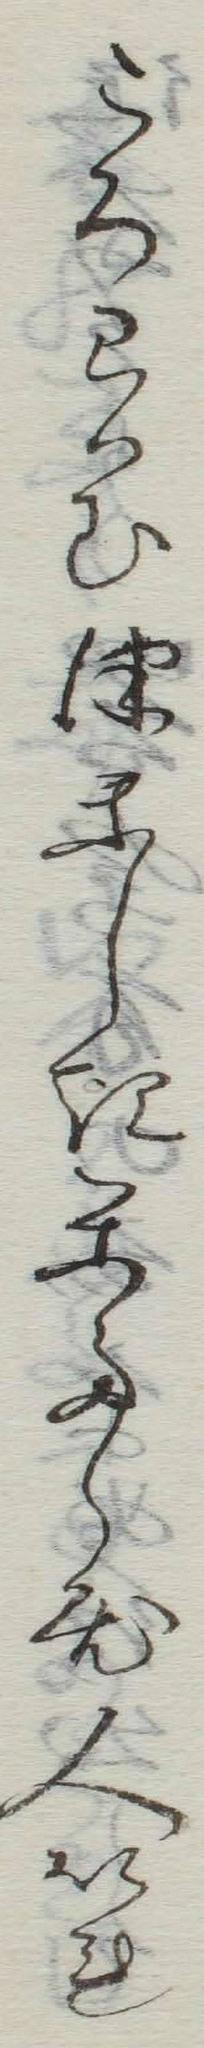ころわかむつましきかたらひ人いれ
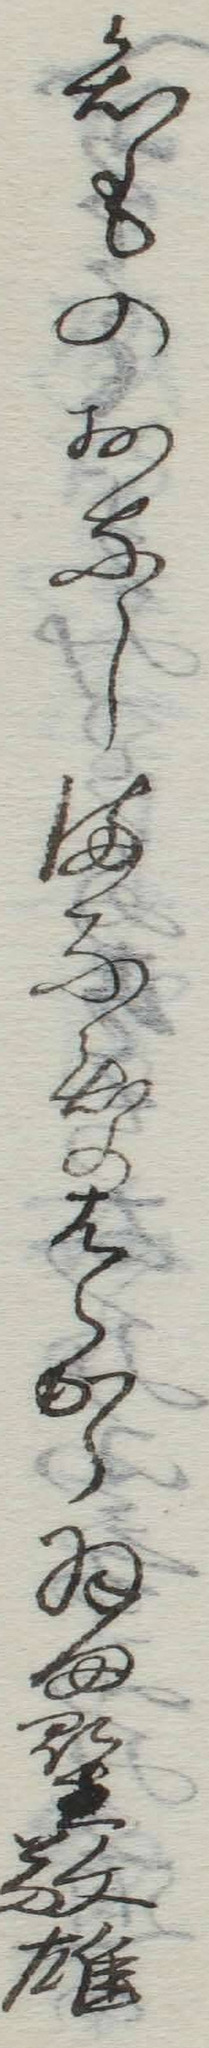ひものおなしまなひのはらから羽田野敬雄
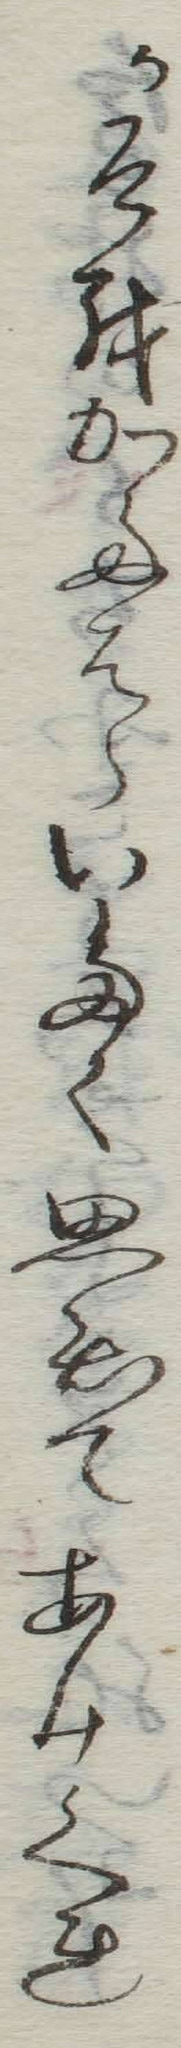かそをかたはらいたく思ひてあけくれ

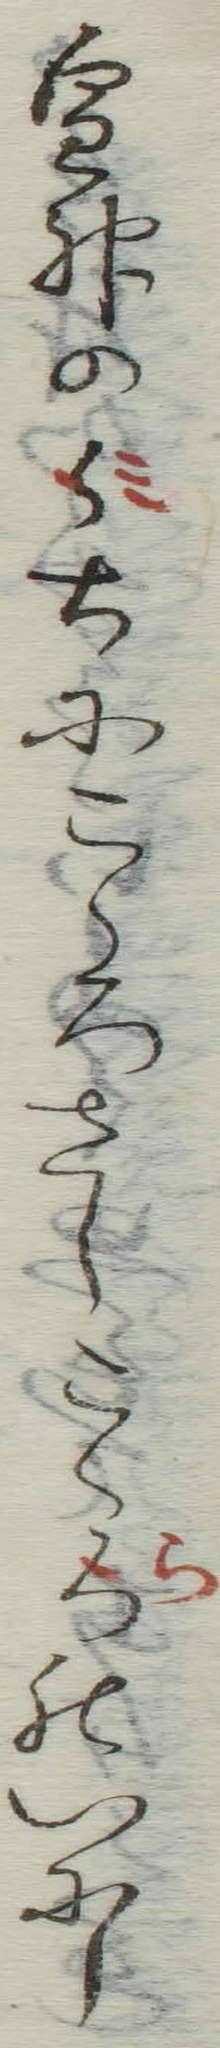皇神のみちにこゝろさしこゝらのいにし
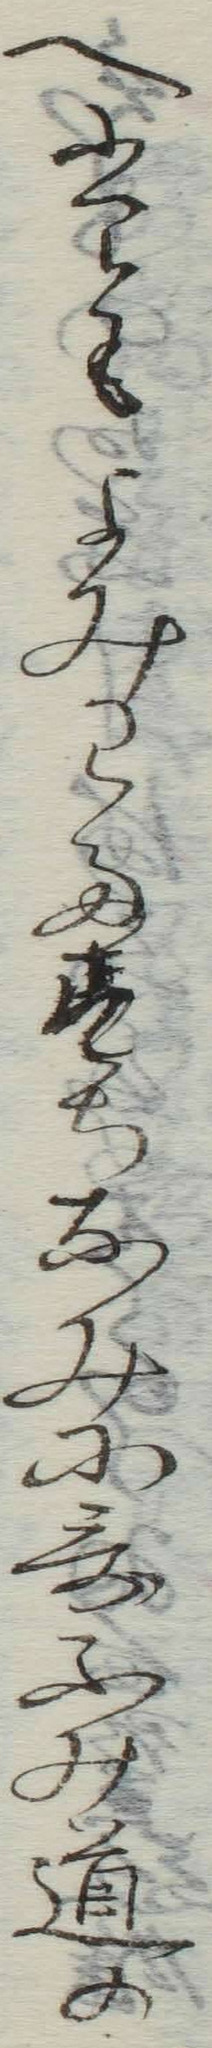へ書ともよみわたすちなみに歌ふみ道の
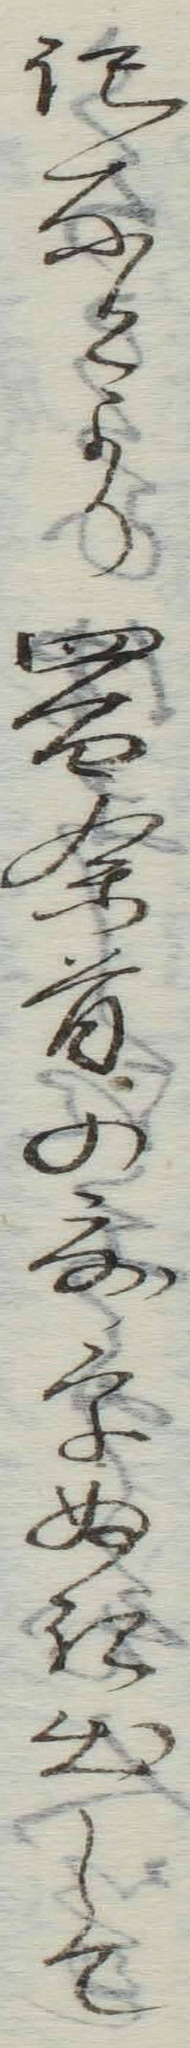記なとより四百余首の歌をぬき出して
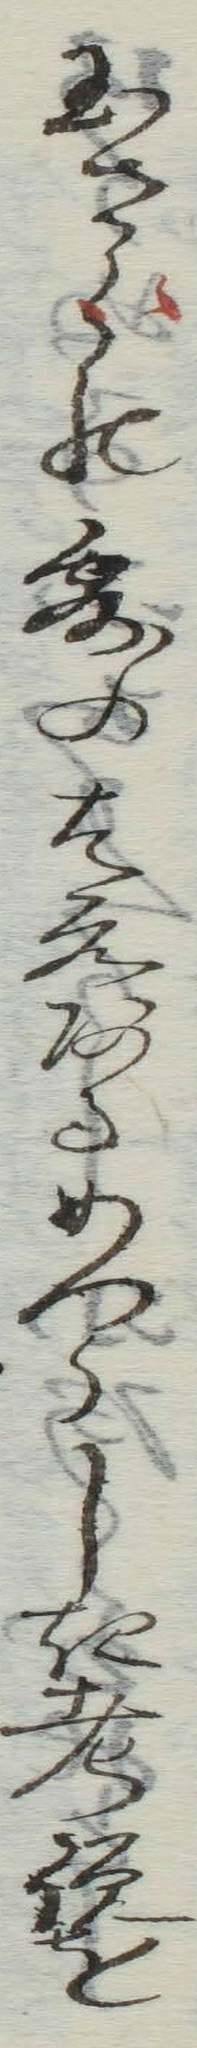玉さゝの露のはえあるめつらしき考説を
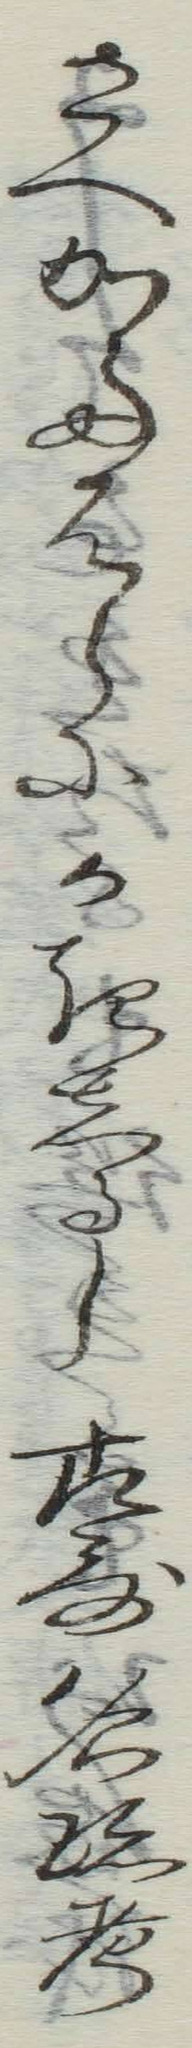さへかたはらにかきしるし古歌名跡考
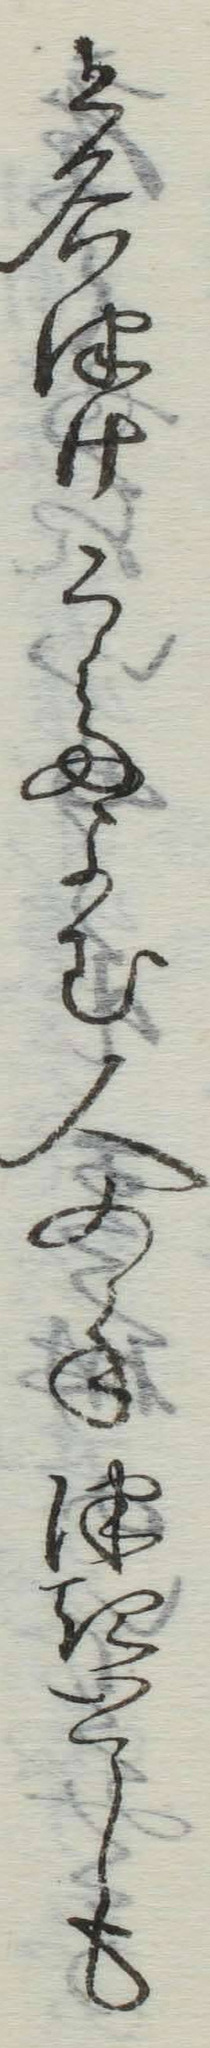と名つけうたよむ人の手つきとしも
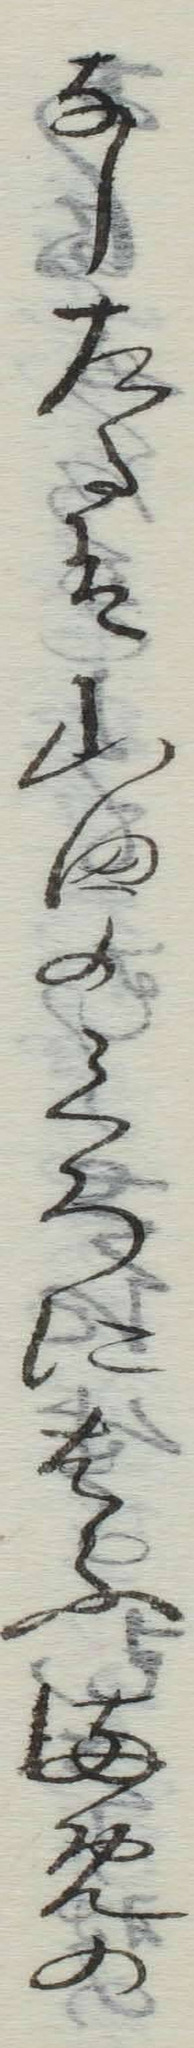なしたるは山田のくろにはふまめの
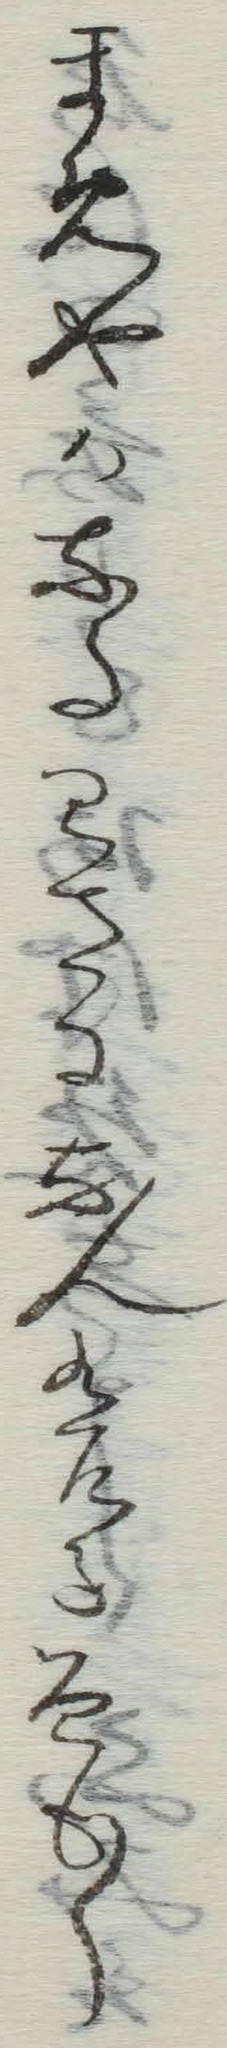まめやかなるわさになん有けるそも〳〵
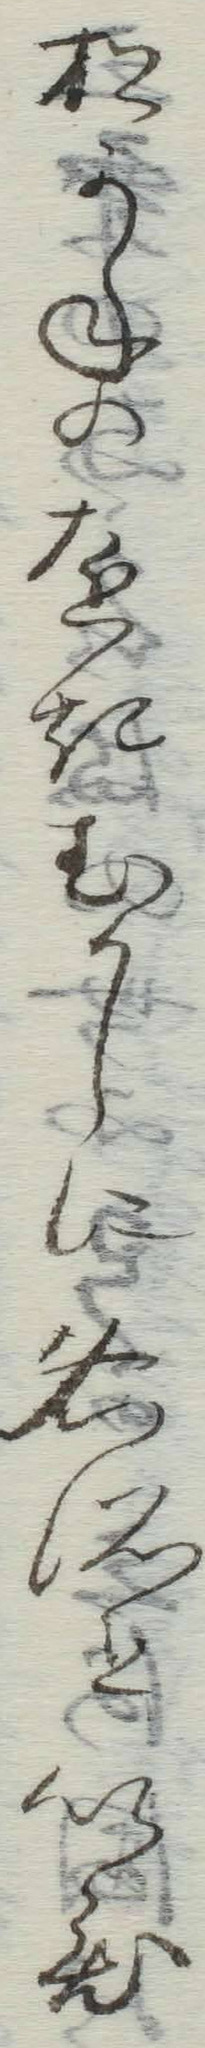松かねの遠きむかしに名所といひ
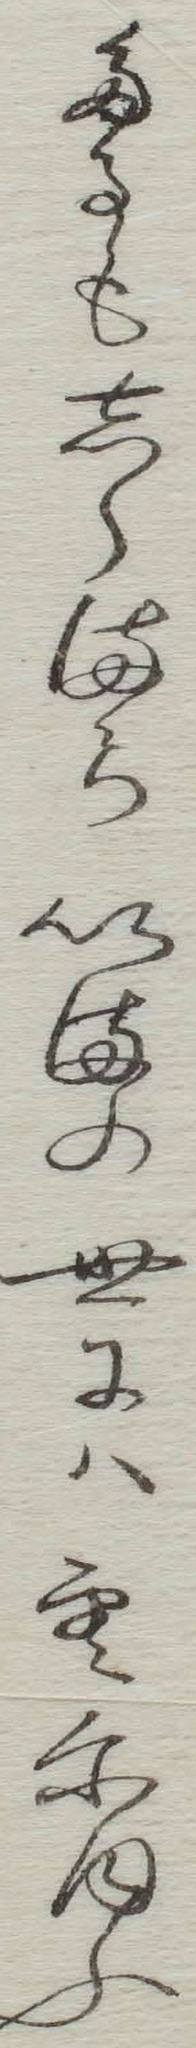たるもしらま弓いまの世には雲にほふ
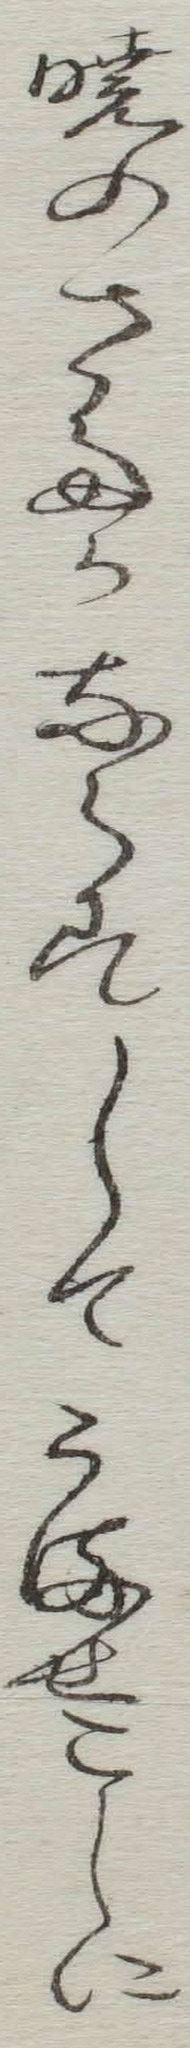暁のさたかならすしてうませこしに
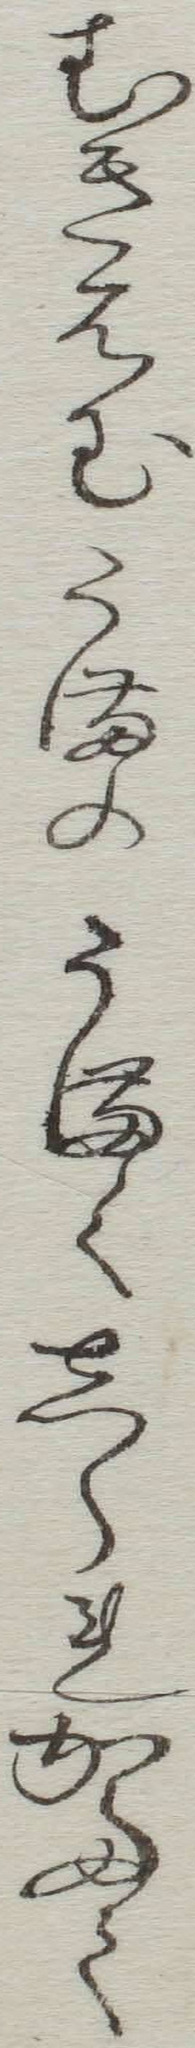むきはむうまのうまくしられかたく
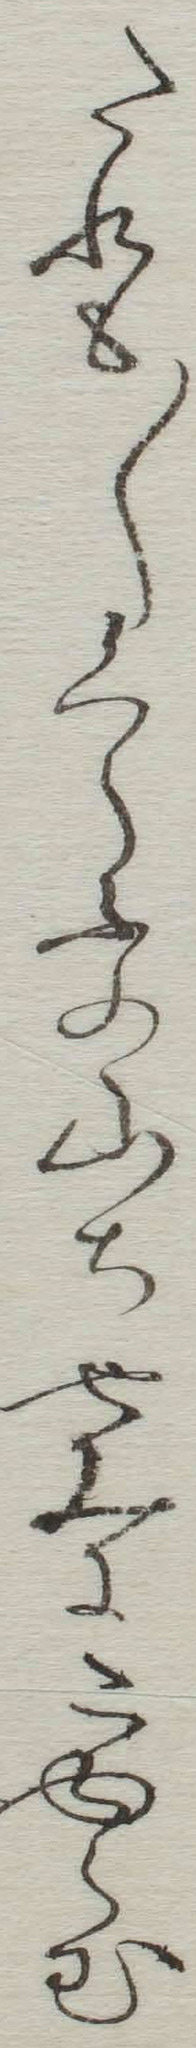たれも〳〵くらふの山ちやみにこゆらむ
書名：三河国古跡考
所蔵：国文学研究資料館
